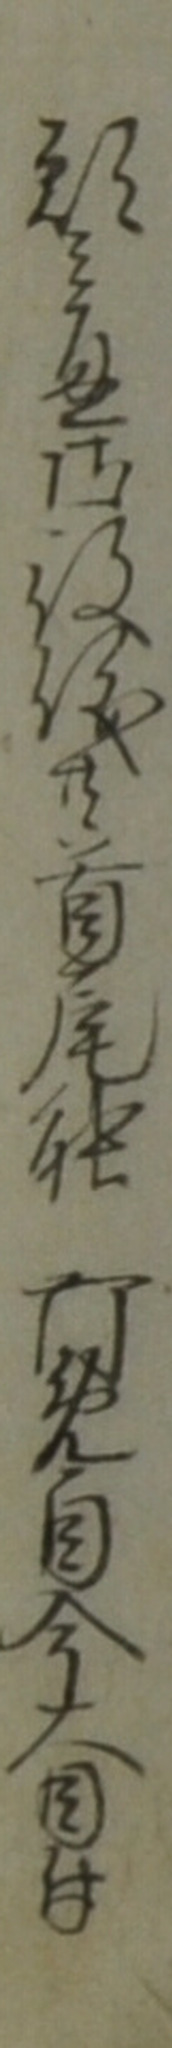願之通御役儀共首尾能御免自今大目付

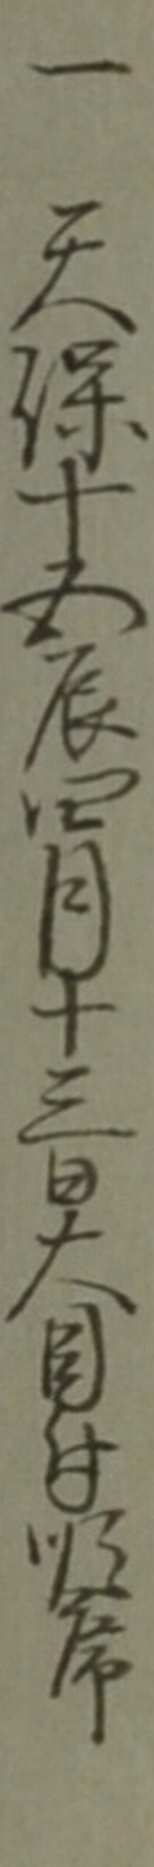一天保十五辰四月十三日大目付順席
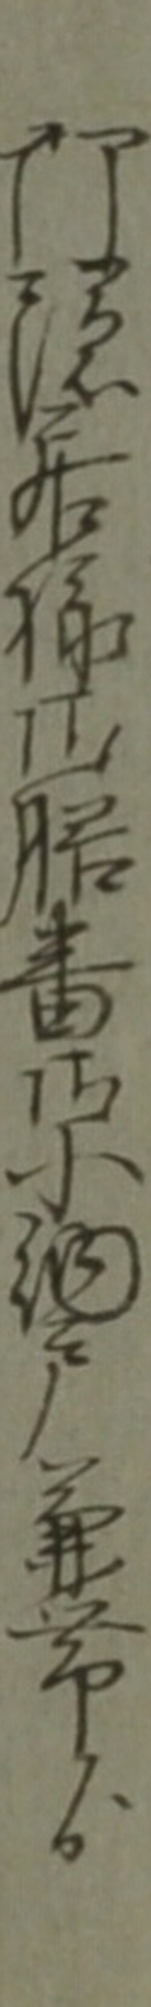御隠居様御膳番御小納戸兼帯ゟ
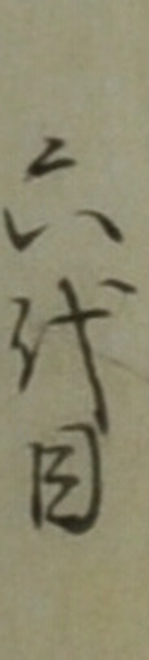六代目
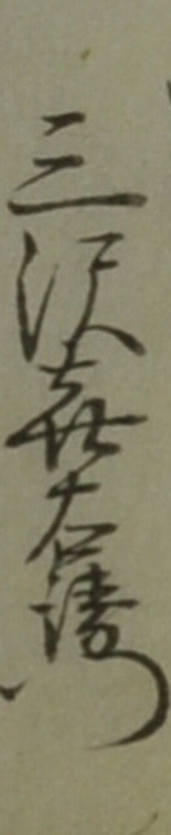三沢喜右衛門
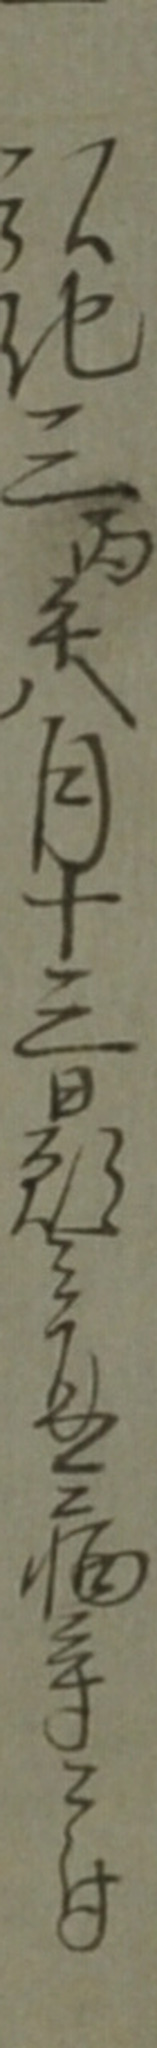一弘化三丙午八月十三日願之通病気ニ付
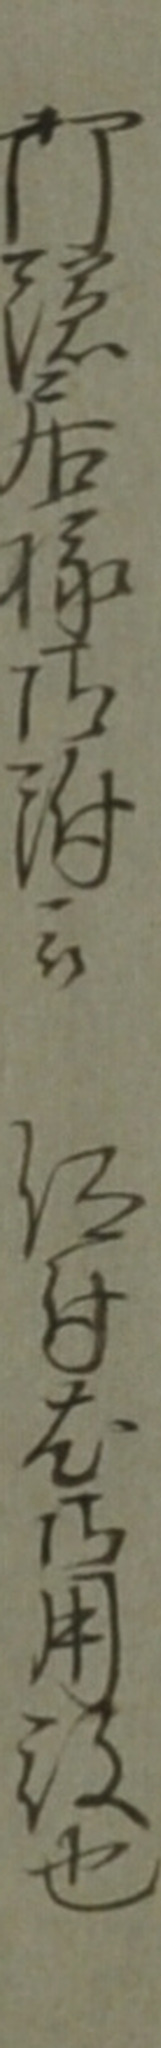御隠居様御附被仰付尤御用役也
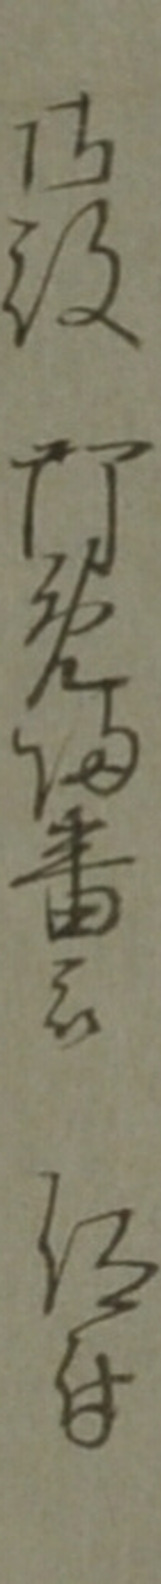御役御免帰番被仰付
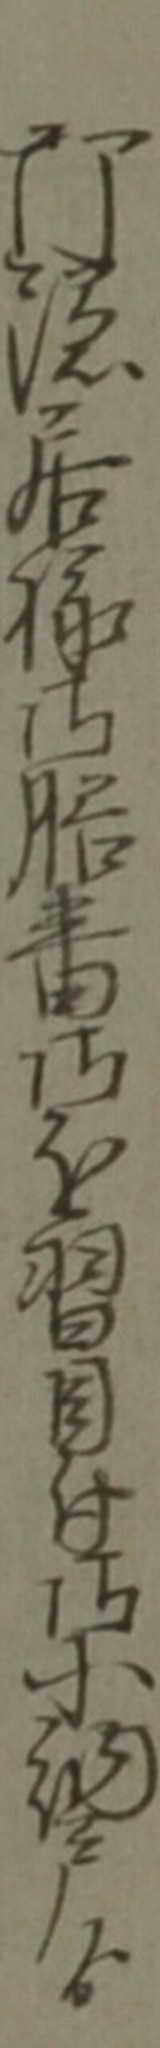御隠居様御膳番御近習目付御小納戸ゟ
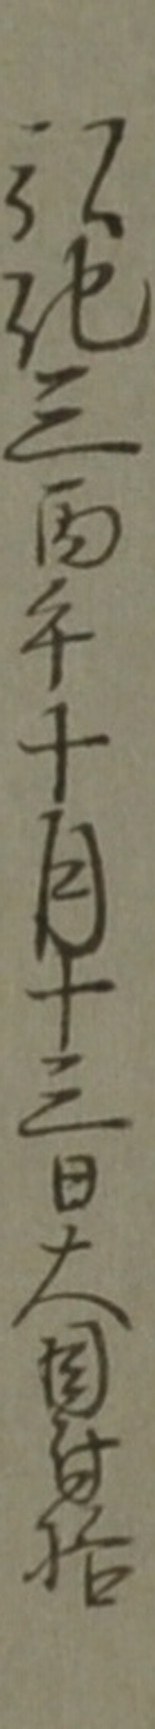一弘化三丙午八月十三日大目付格
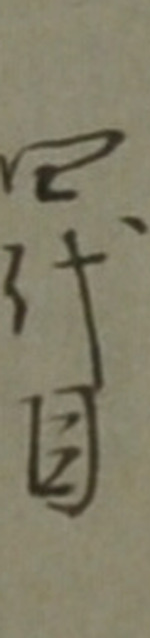四代目
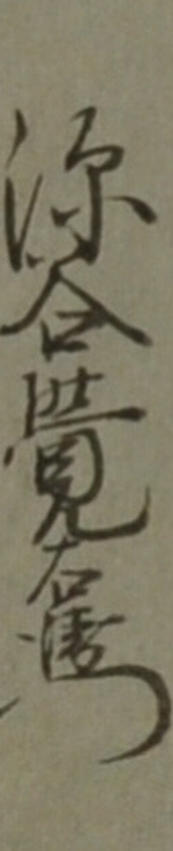深谷覚右衛門
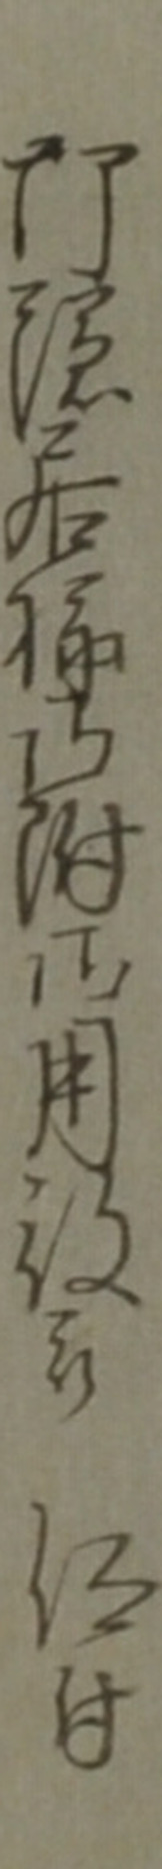御隠居様御附御用役被仰付
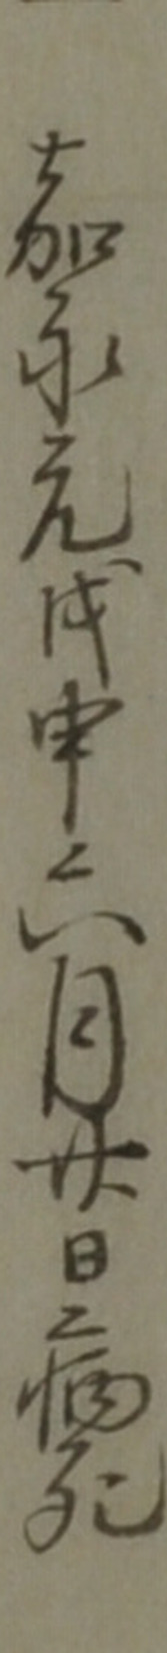一嘉永元戊申六月廿日病死
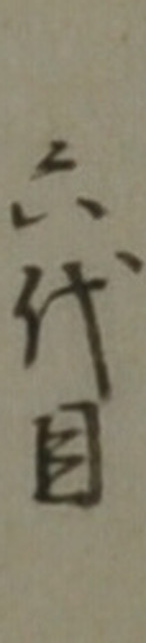六代目
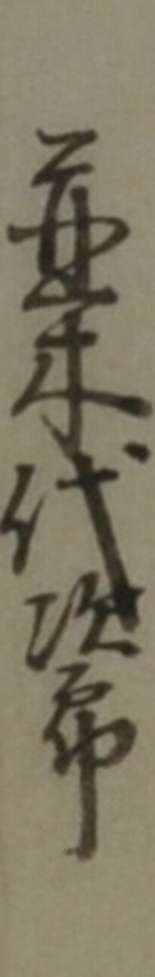並木代次郎
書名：諸御役代々録（二）
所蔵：伊那市立高遠町図書館・合同会社AMANE
